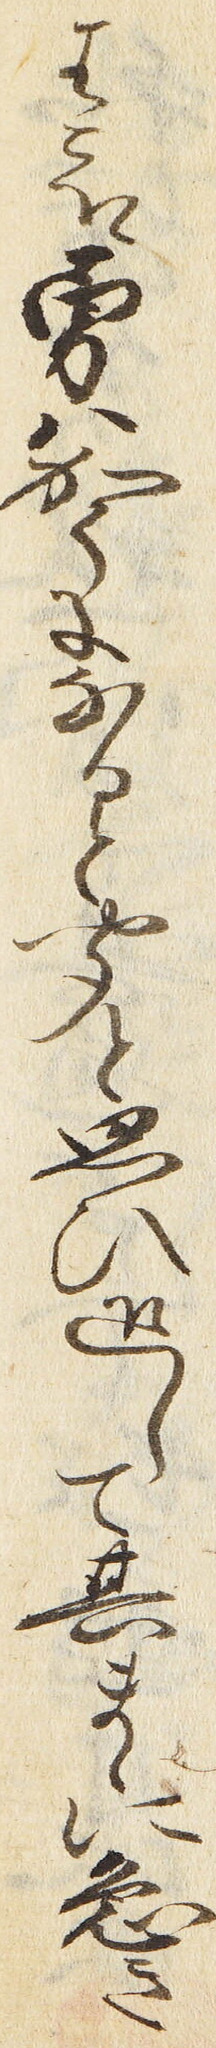はこそ勇はかうになると聞と思ひ返して其まゝに急き
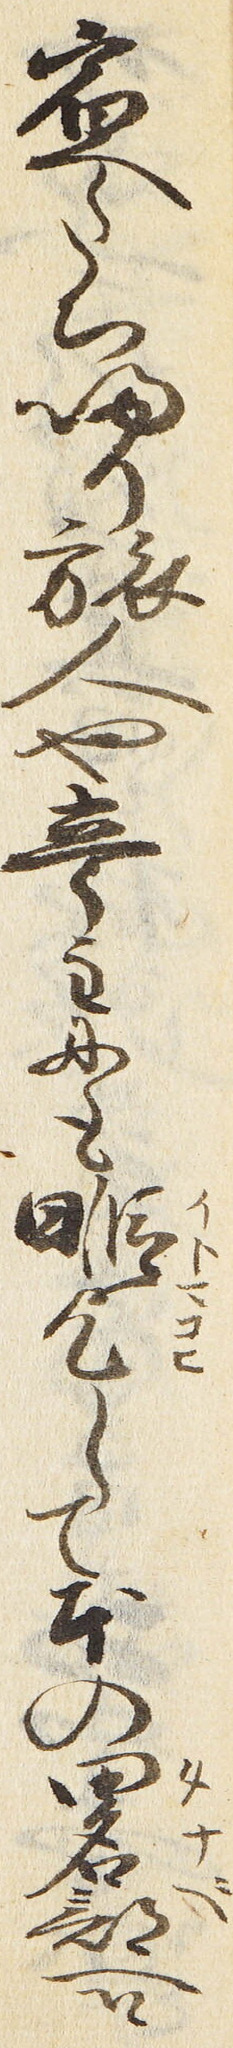宿へたち帰り旅人や亭主にも暇乞して本の田名部へそ
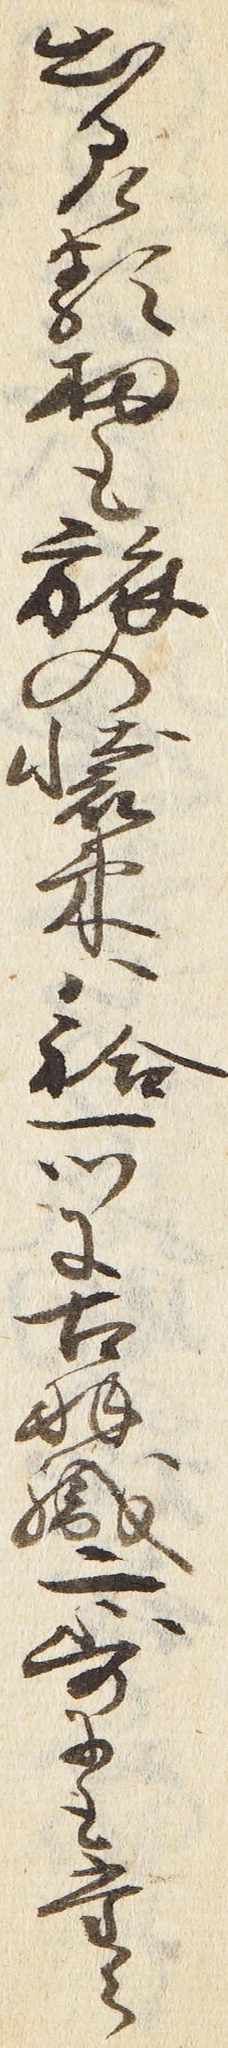出るける扨も旅の装束は袷一ツに古羽織二歩にもたら
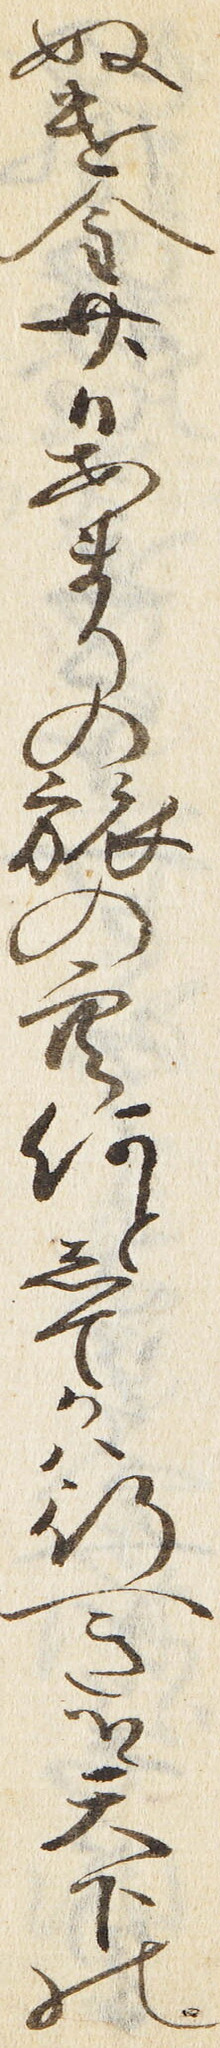ぬ遣金廿日あまりの旅の空何としてかは行へきそ天下の
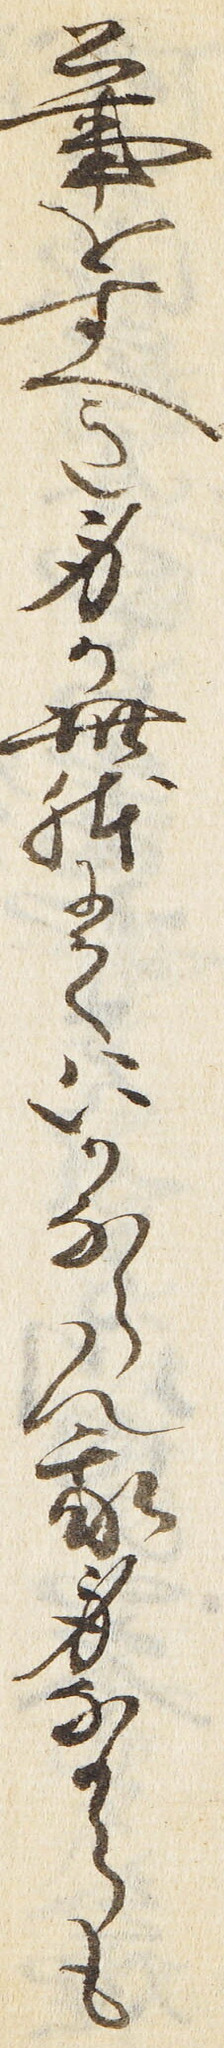公事をすへき身の此体にてはいかならん我身なからも
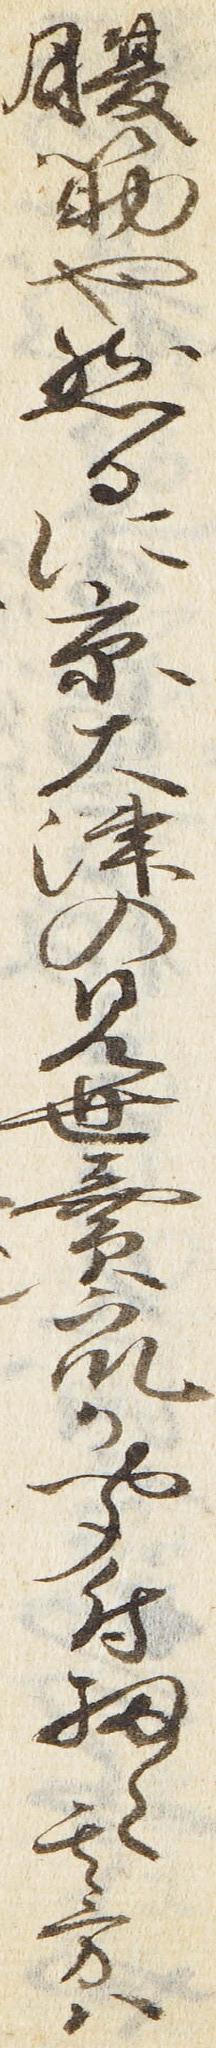腹筋や然るに京大津の見世売衆か聞付扨々其方は
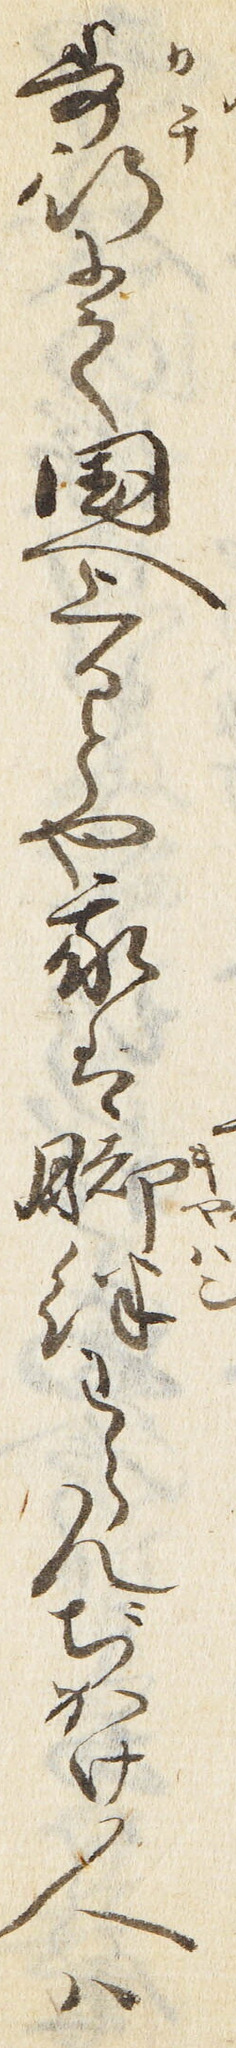歩行にて国へ上るとや我は脚絆わらんぢかけ人は
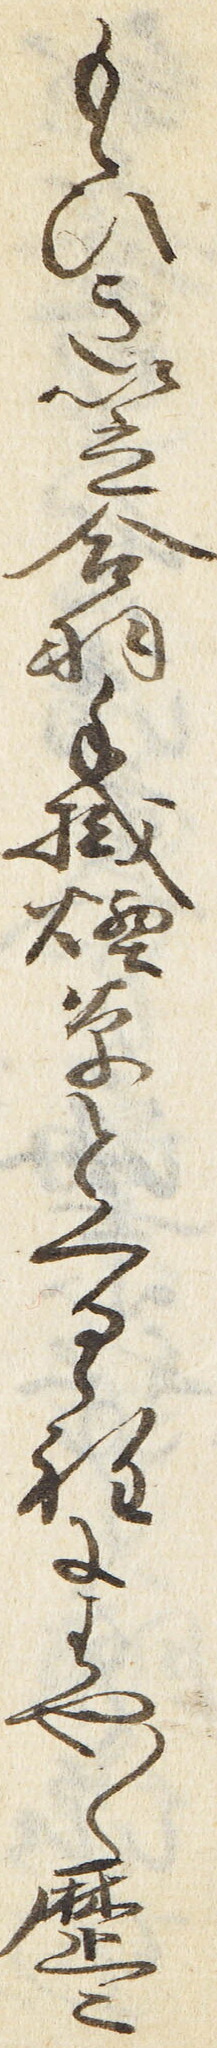もゝひき笠合羽手拭煙草とくるゝ程にはや〳〵歴々
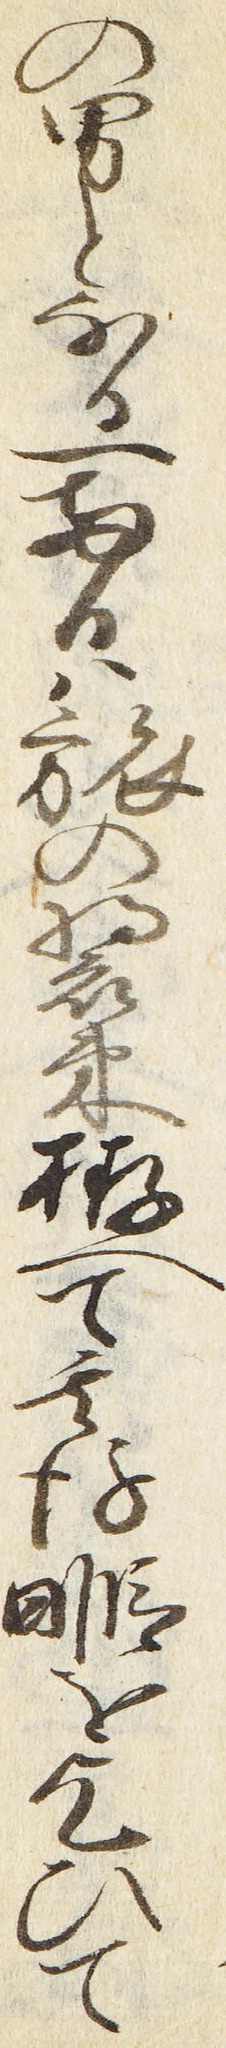の男となる一両日は旅の装束拵へて其後暇を乞ひて
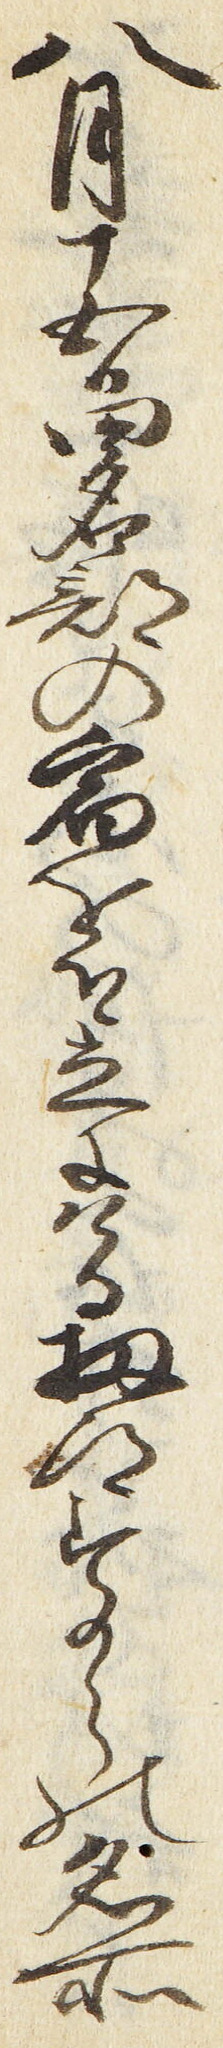八月十五日田名部の宿をそ立にける扨道すからの名所

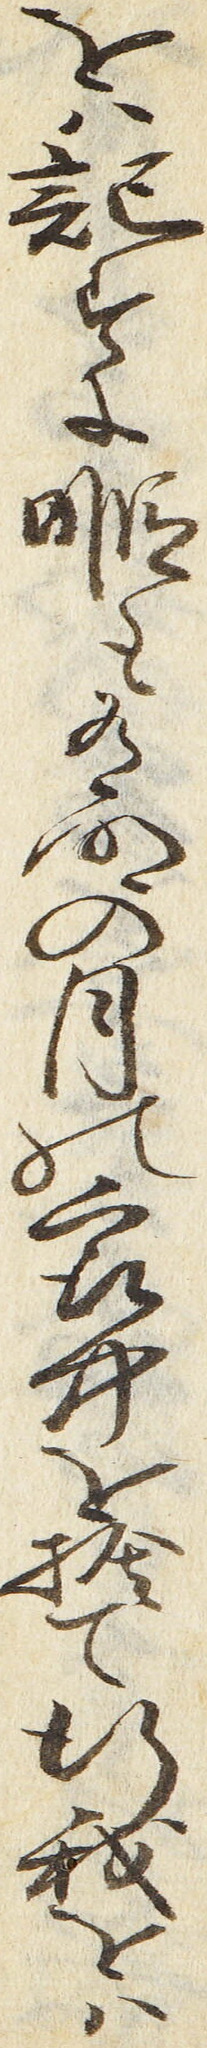をは記すに暇も有明の月の最中を捨て行我をは
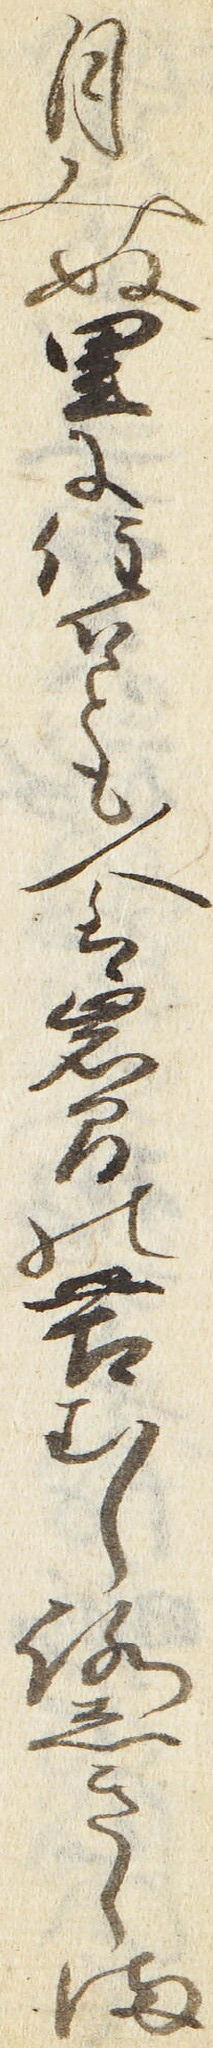月みぬ里に住候とも人は岩間の苔むしろしきしま
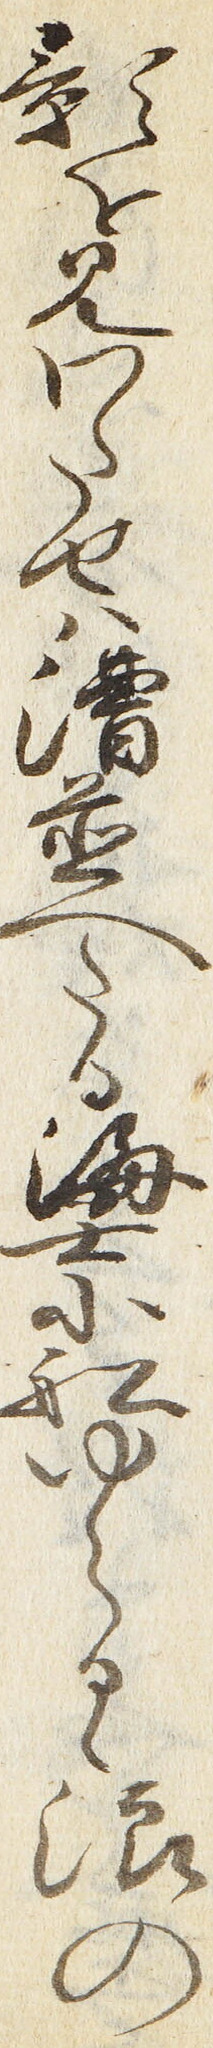影を見わたせは漕並へたる海士小船ゆらるゝ浪の
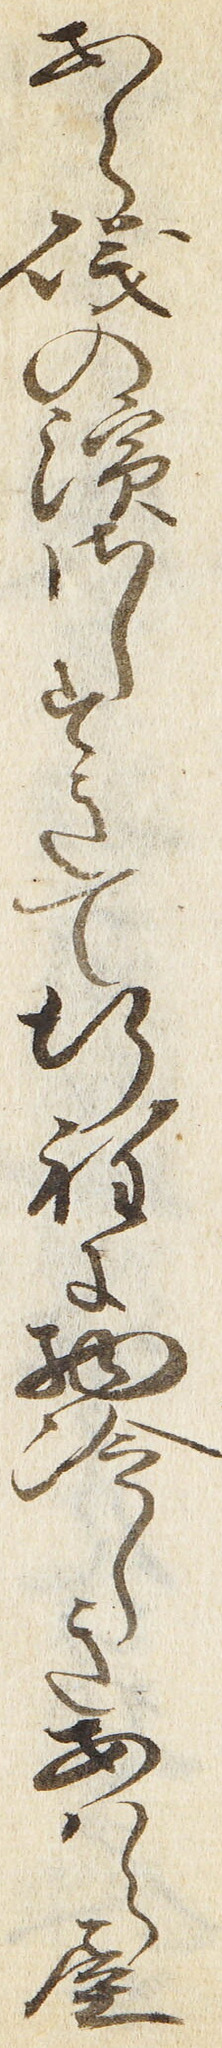あら磯の浜さしすきて行程に物冷しきあはら屋
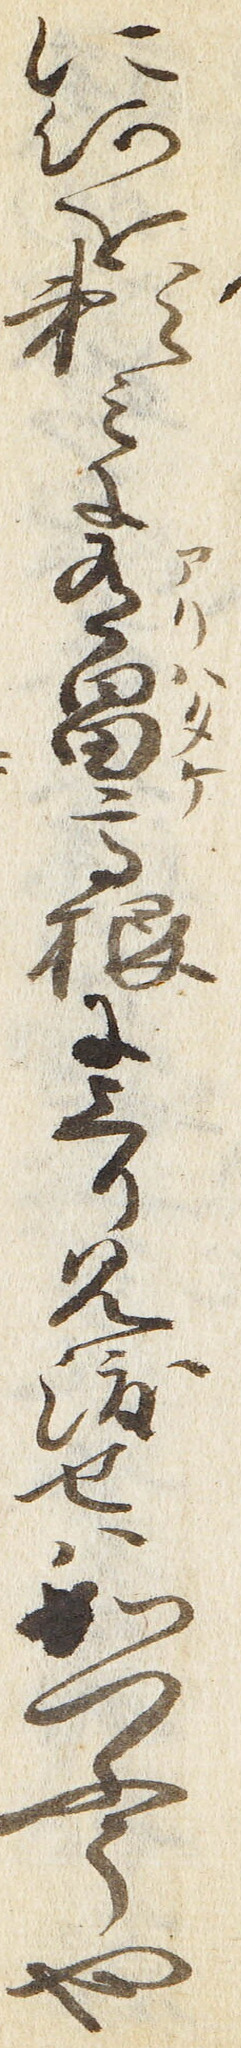に何を頼みに有畠高根に上り見渡せはかつふう也
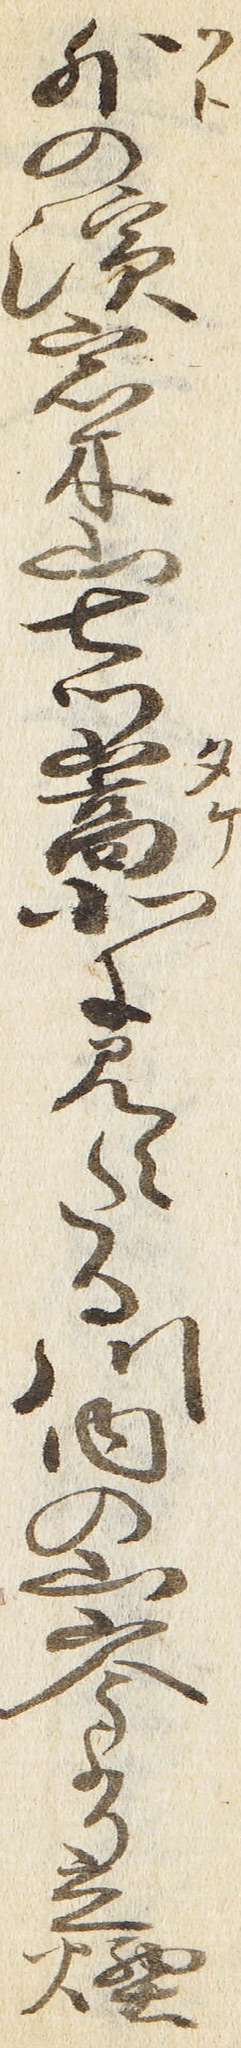外の浜岩木山七ツ嵩北に見えたる川内の山峯より立煙
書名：海陸世話日記
